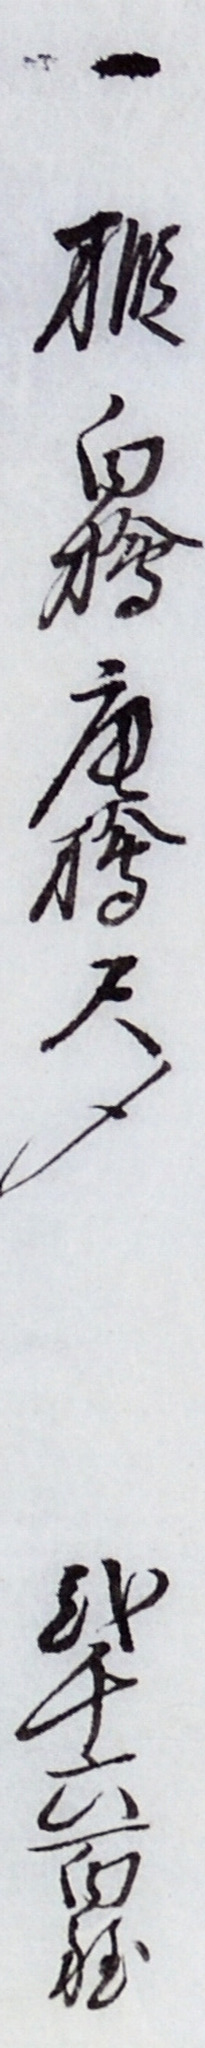一樅白檜唐檜尺〆弐千六百程
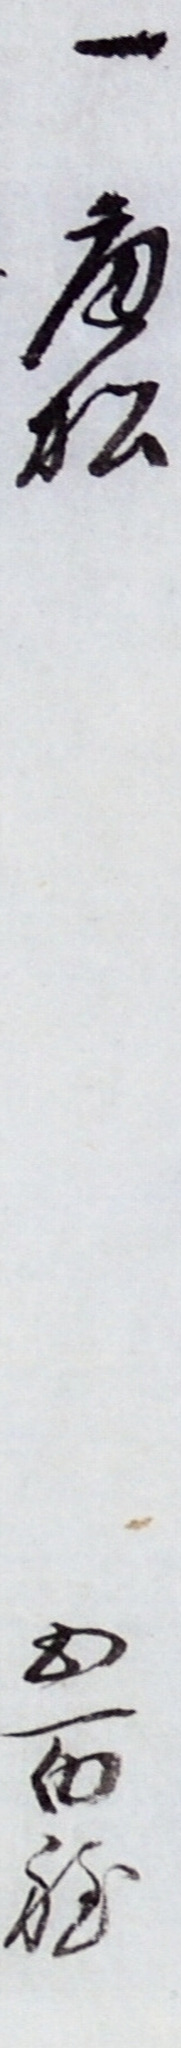一唐松五百程
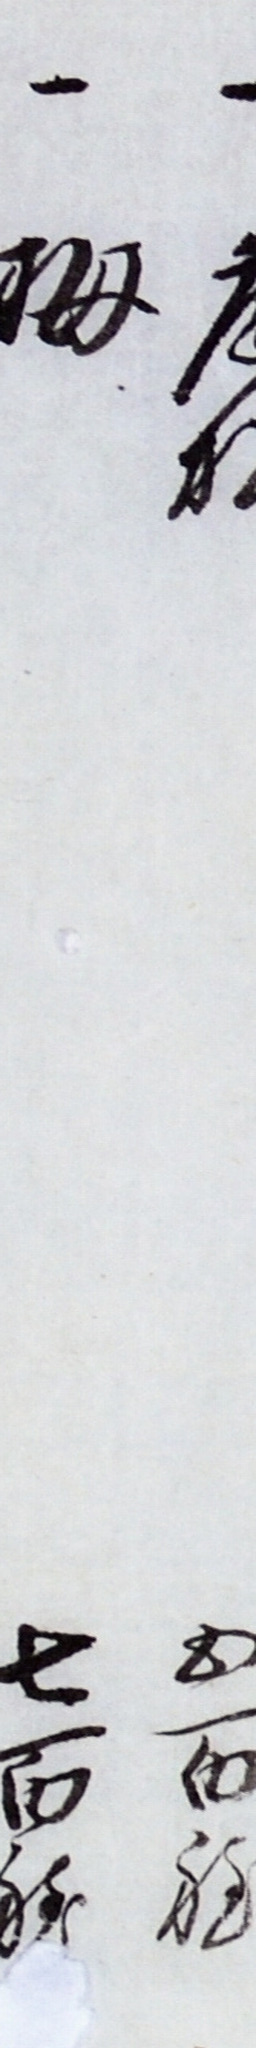一栂七百程
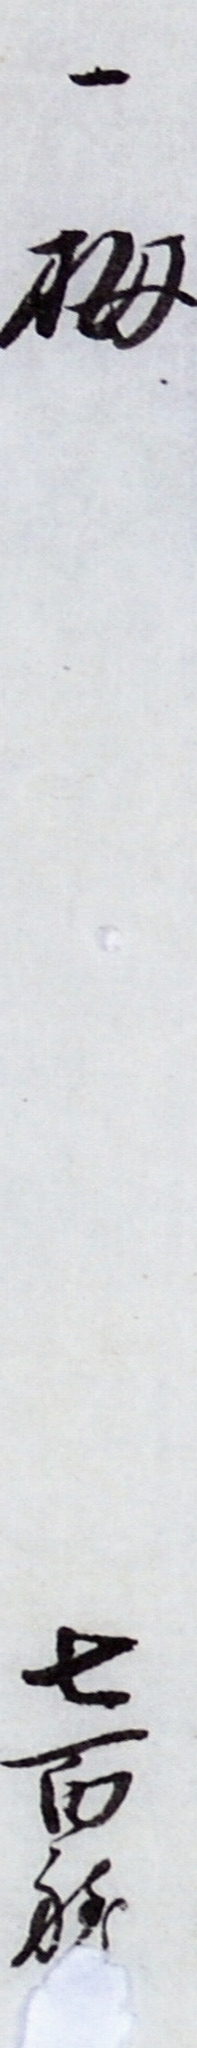一栂七百程
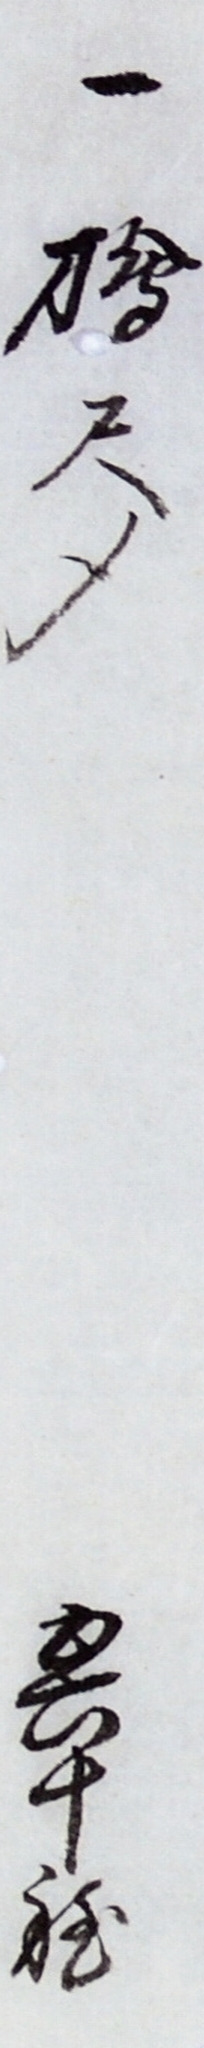一檜尺〆五六十程

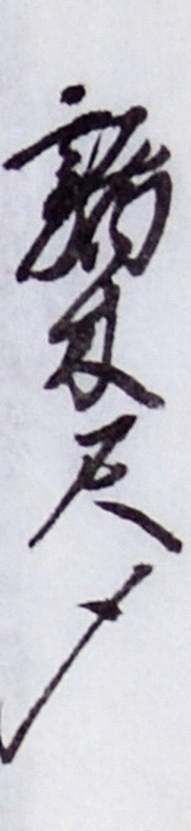椹木尺〆
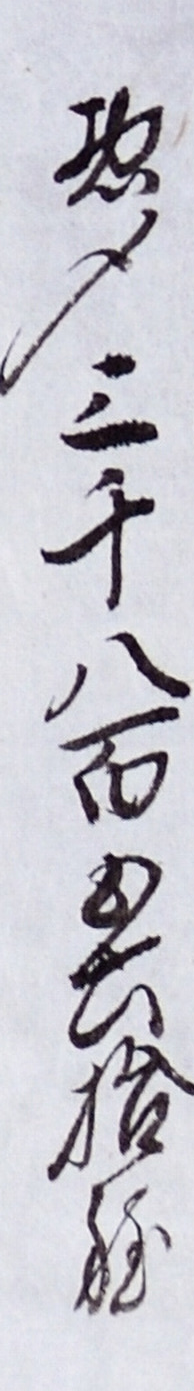惣〆三千八百五拾程
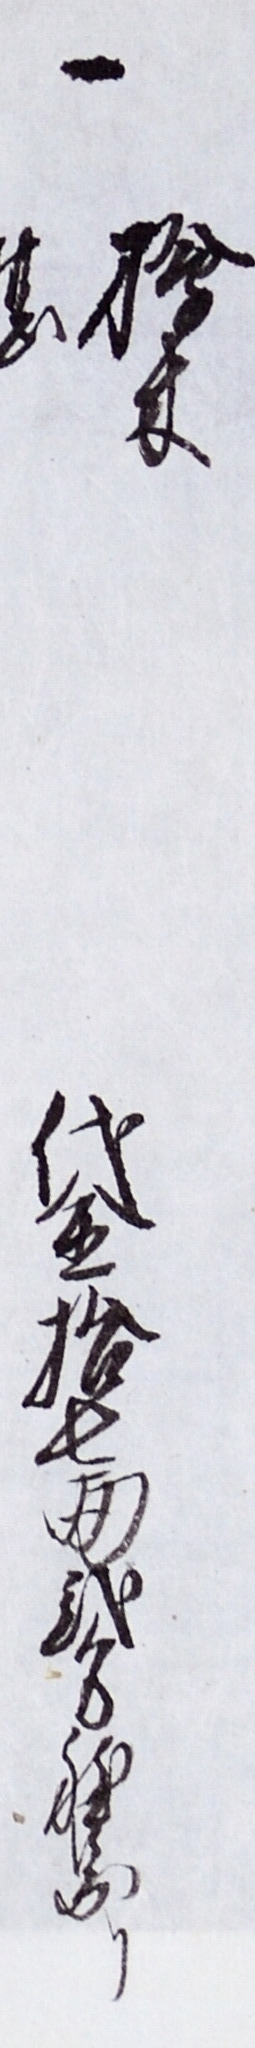一檜木代金拾七両弐分程図り
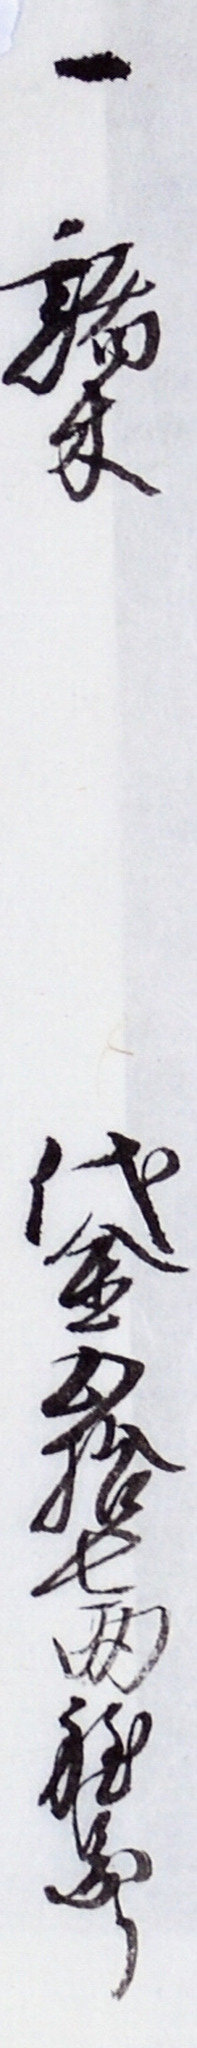一諸木代金五拾七両程図り
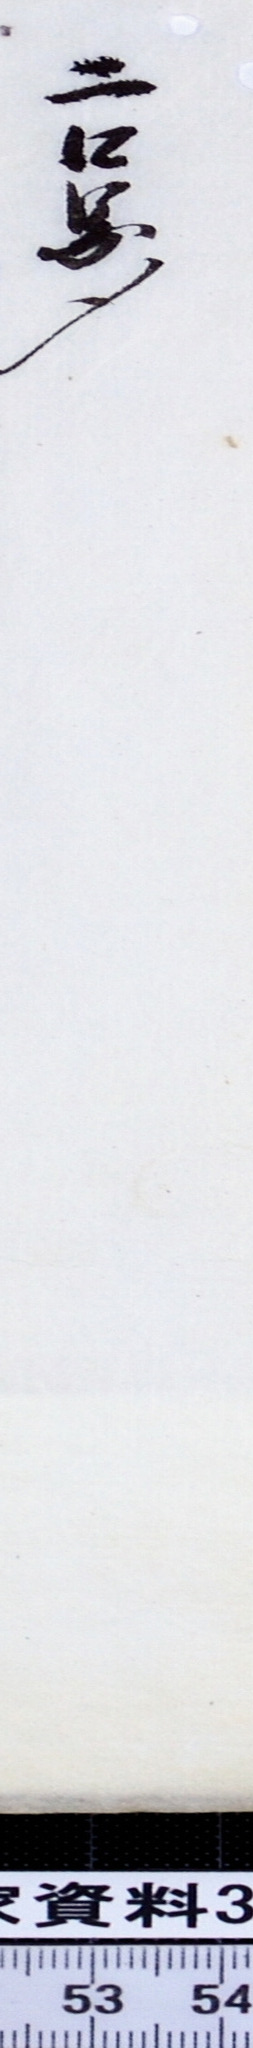二口図〆
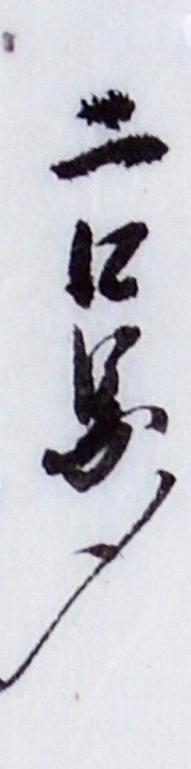二口図〆
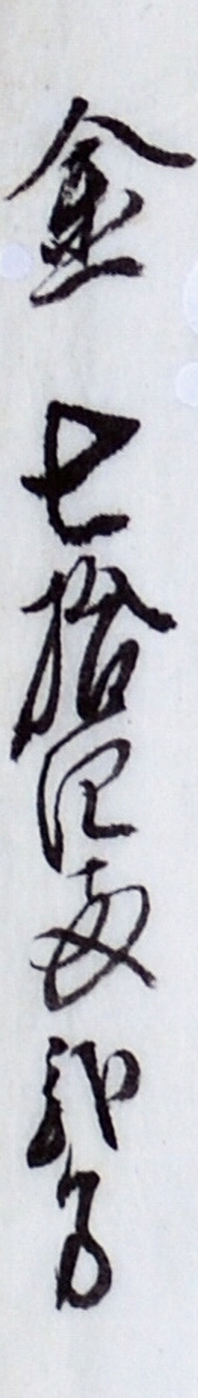金七拾四両弐分
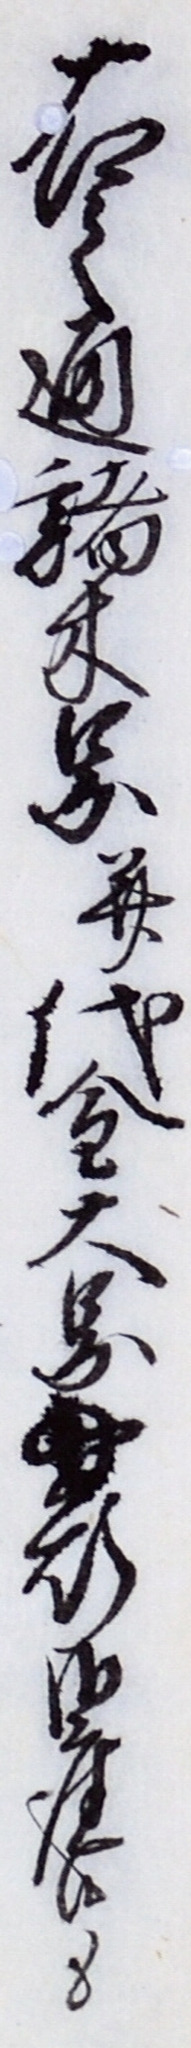右之通諸木図并代金大図預御座候以上
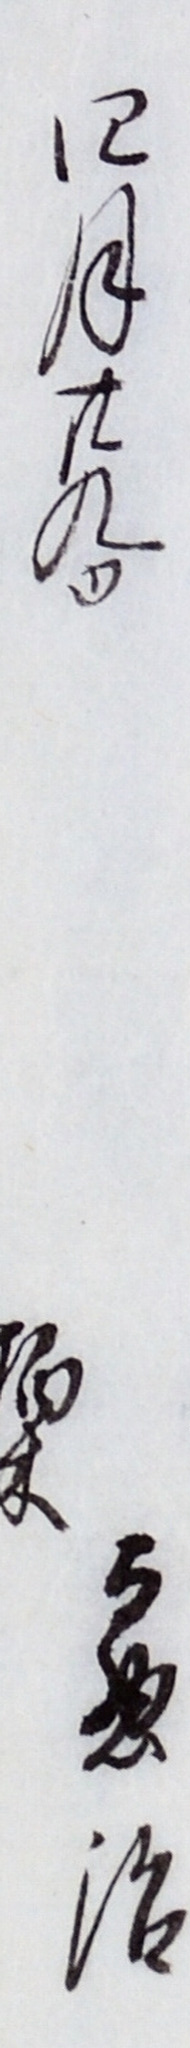四月廿九日与惣治
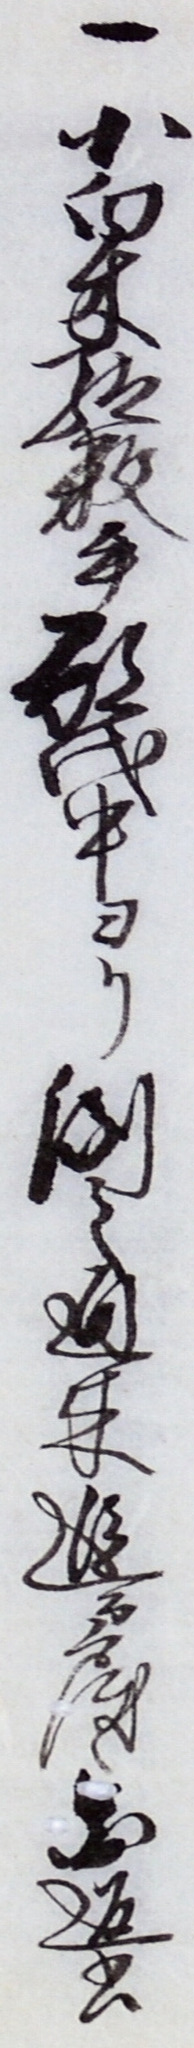一小白木駄数ヲ郡代中ヨリ例之通来追而戻し出返書
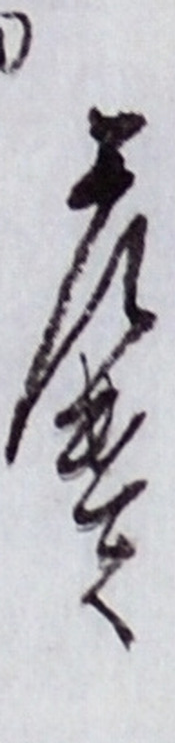差遺候
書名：御山奉行御用控
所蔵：伊那市立高遠町図書館・合同会社AMANE
